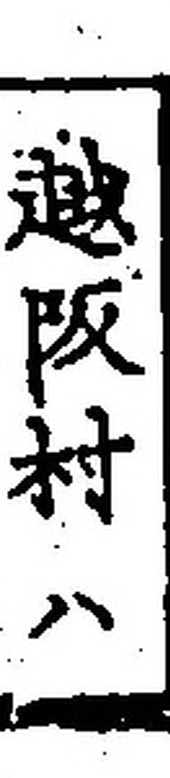越阪村ハ
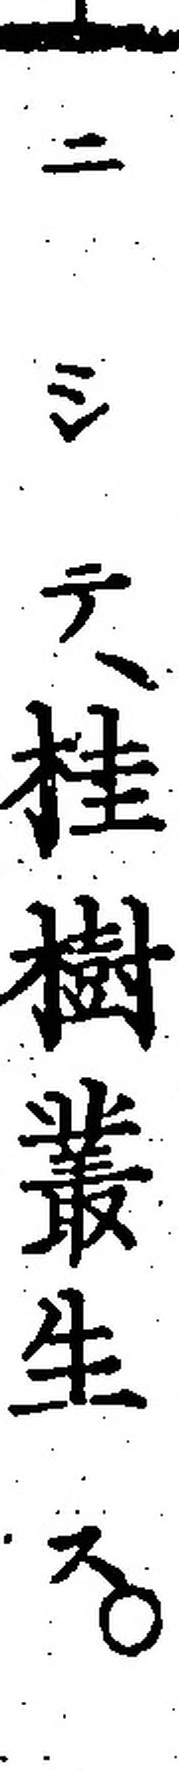ニシテ、桂樹叢生ス。
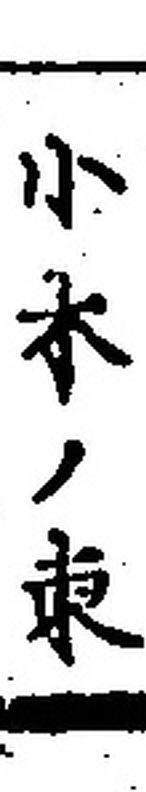小木ノ東
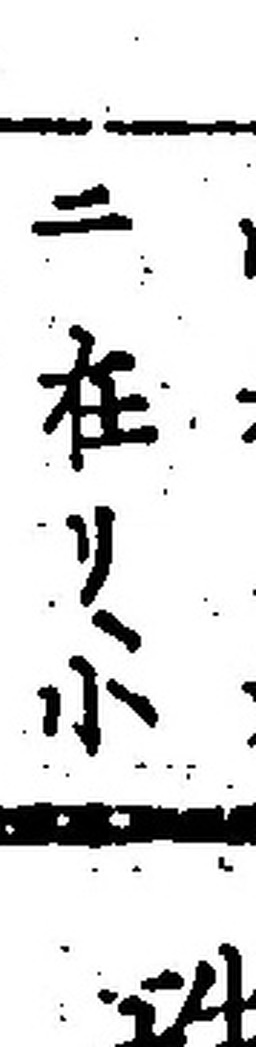ニ在リ、小
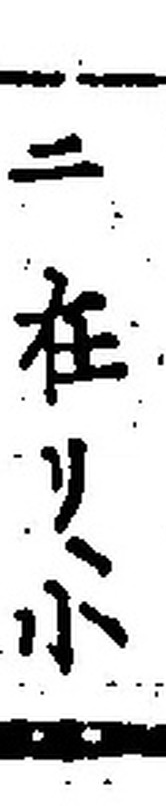ニ在リ、小
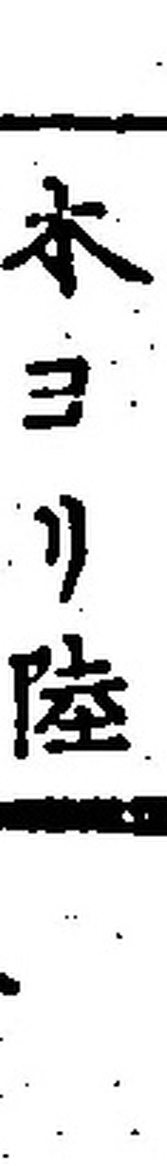木ヨリ陸
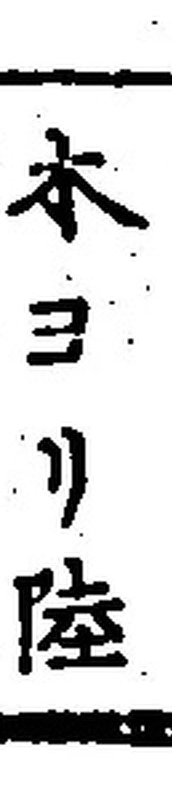木ヨリ陸
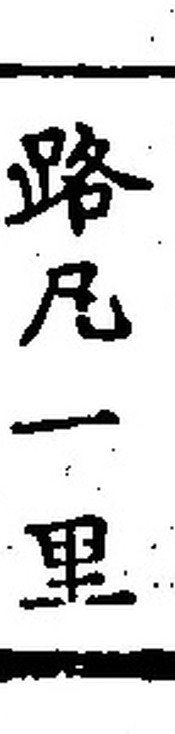路凡一里
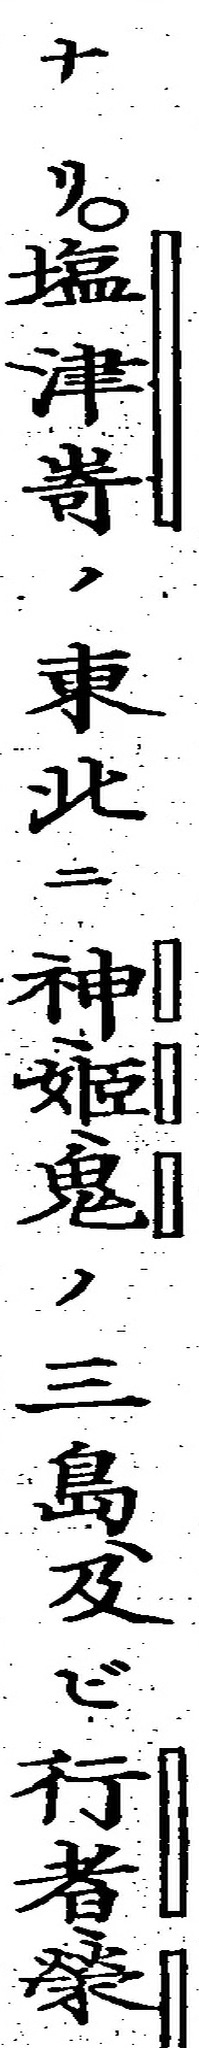ナリ。塩津崎ノ東北ニ神・姫・鬼ノ三島、及ビ行者・栄
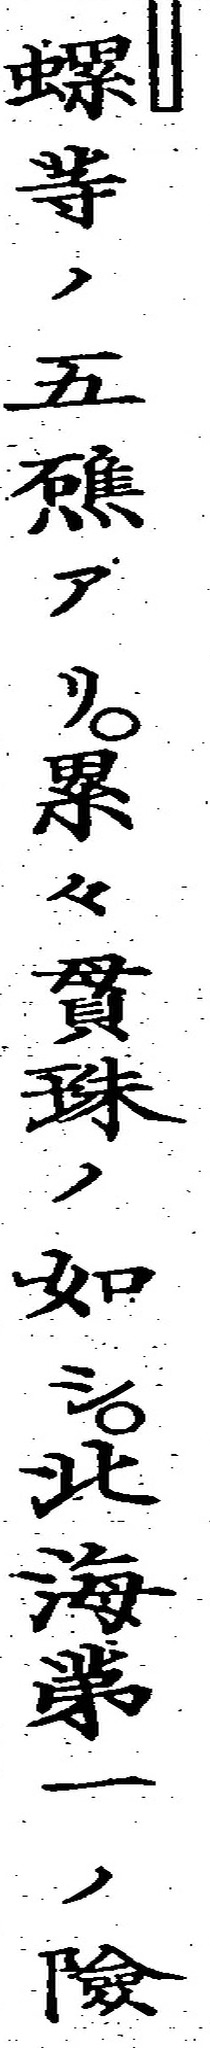螺等ノ五礁アリ。累々貫珠ノ如シ。北海第一ノ険
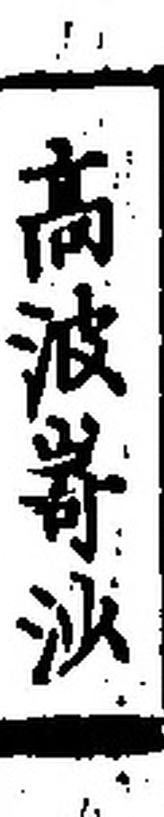高波崎沙
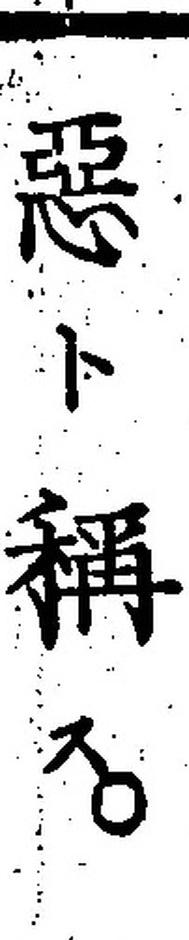悪ト称ス。
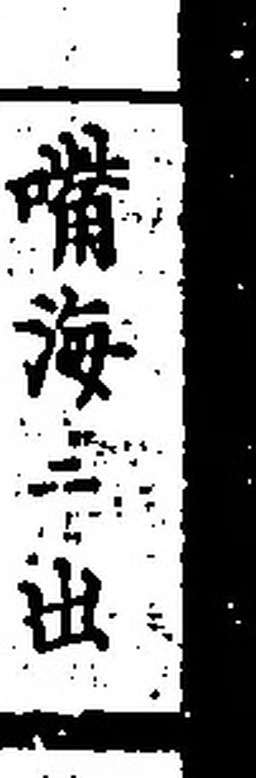嘴海ニ出
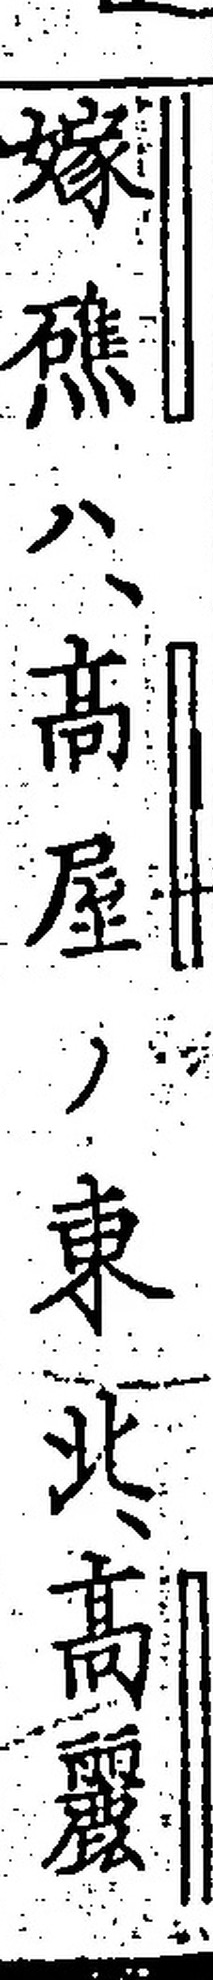嫁礁ハ、高屋ノ東北、高麗
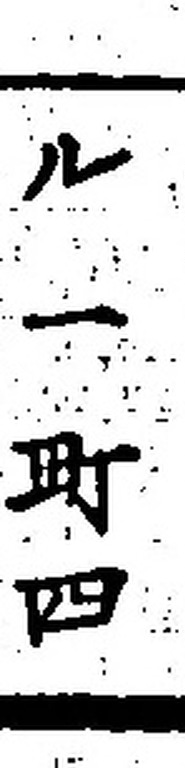ル一町四
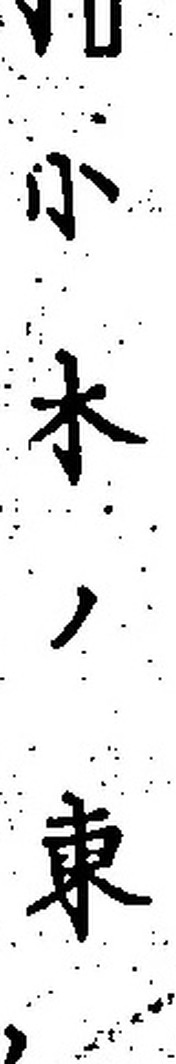小木ノ東
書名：能登地誌略
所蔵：国立国会図書館 National Diet Library, JAPAN
